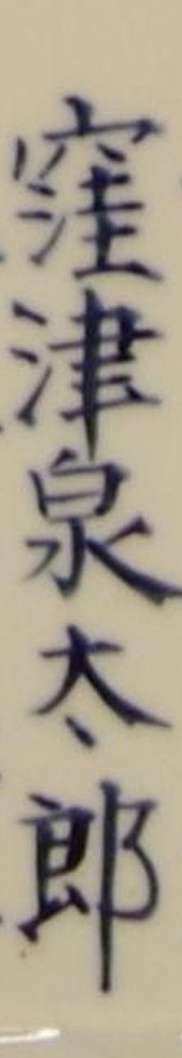窪津泉太郎
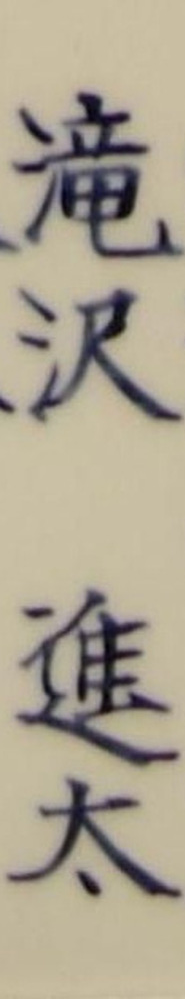滝沢進太
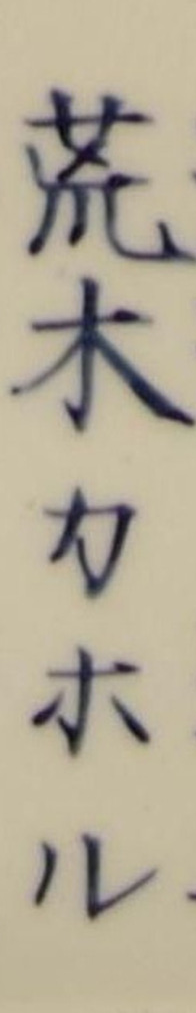荒木カオル
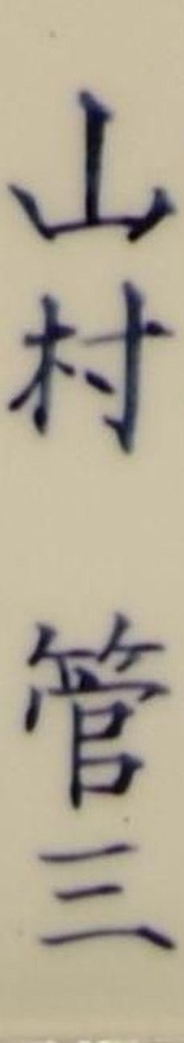山村管三
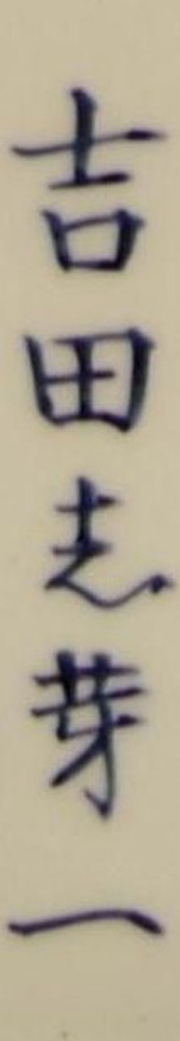吉田志芽一
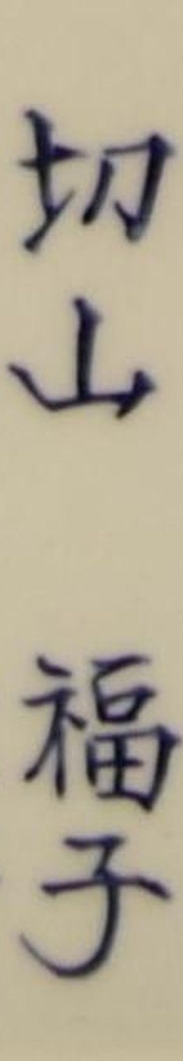切山福子
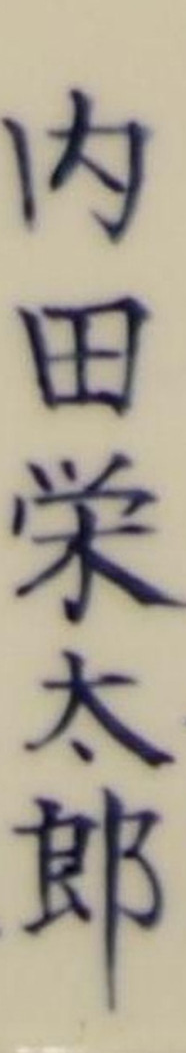内田栄太郎
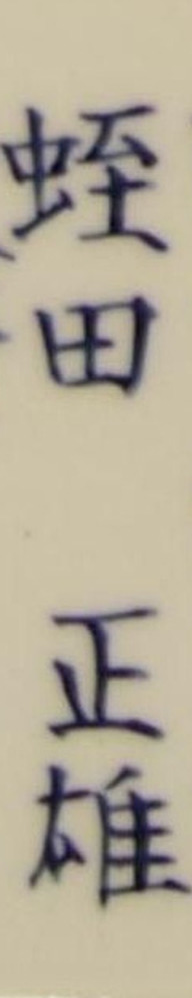蛭田正雄
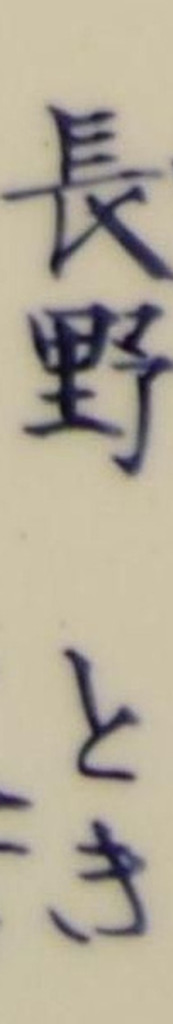長野とき
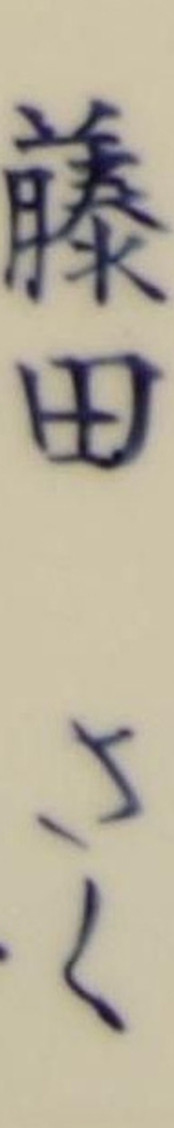藤田さく
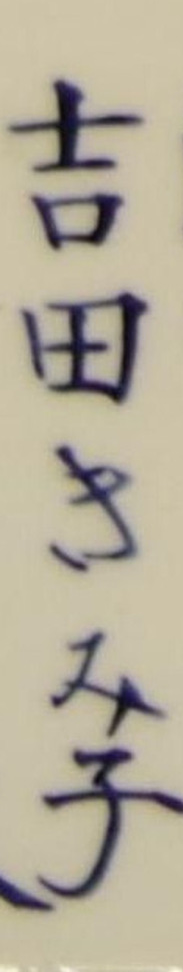吉田きみ子
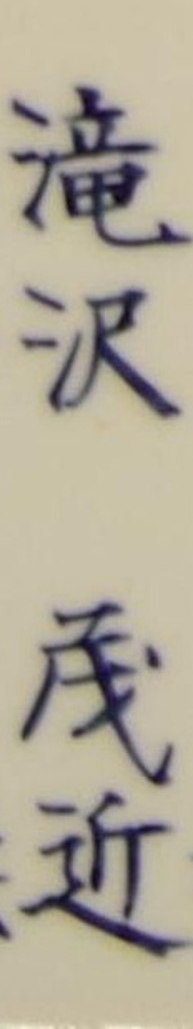滝沢茂近
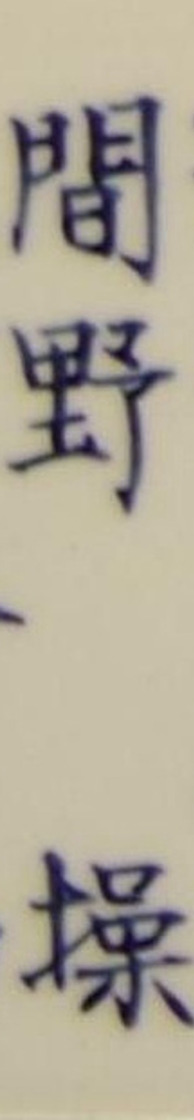間野操
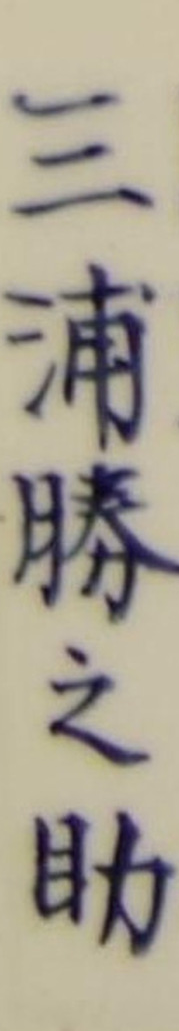三浦勝之助

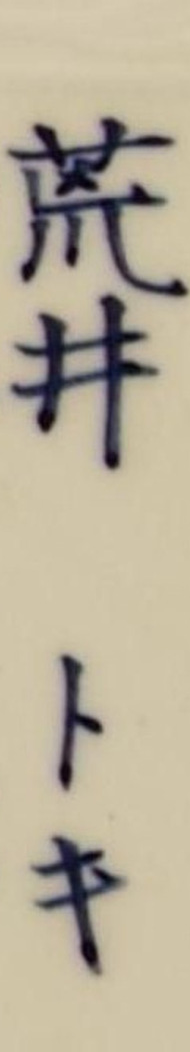荒井トキ
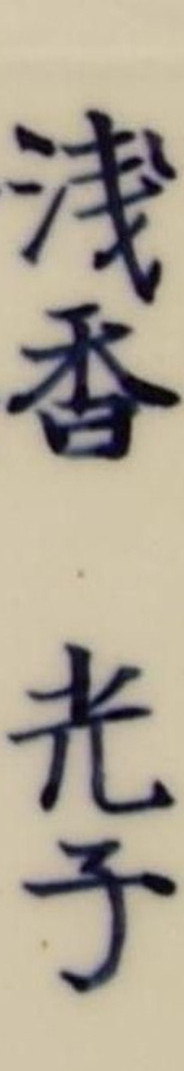浅香光子
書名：A~D
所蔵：koyasan kongobuji
